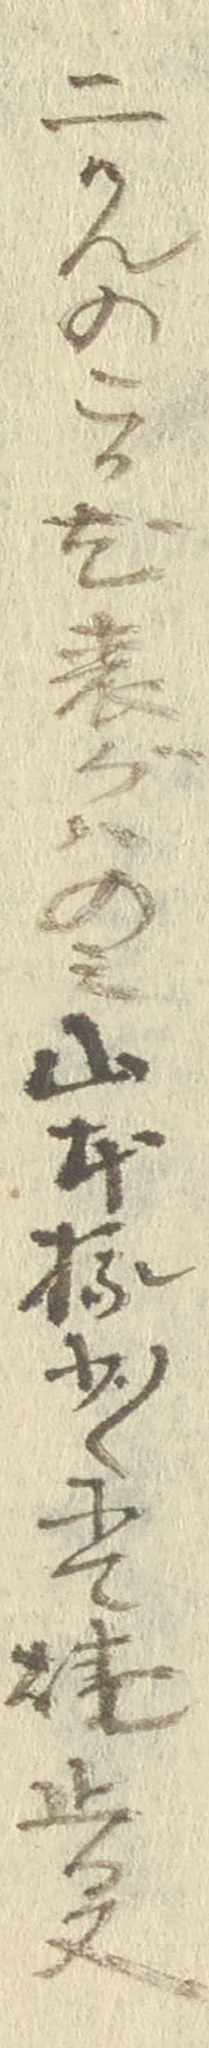二けんのこる尤表がハのミ山本様少〳〵にて焼止る又
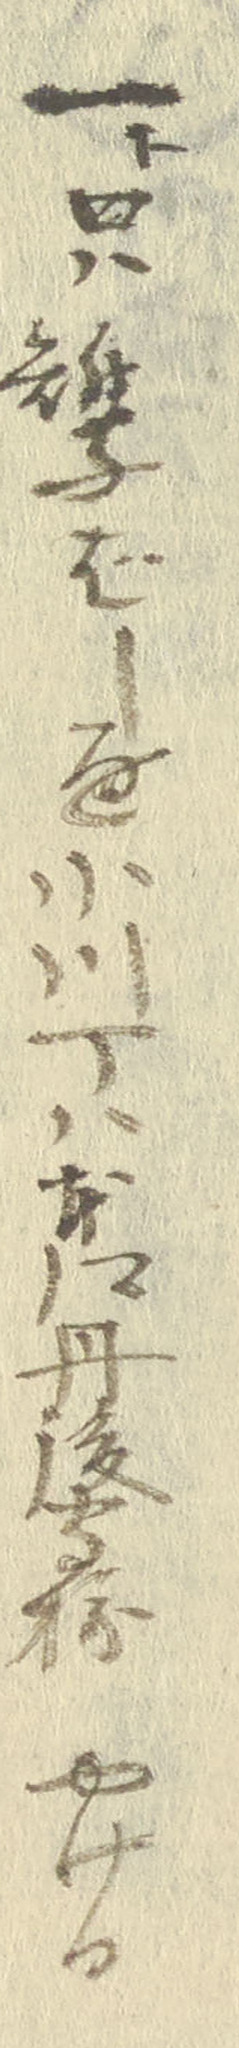一ト口ハ雉子ばし通小川丁ハ本郷丹後守様やける
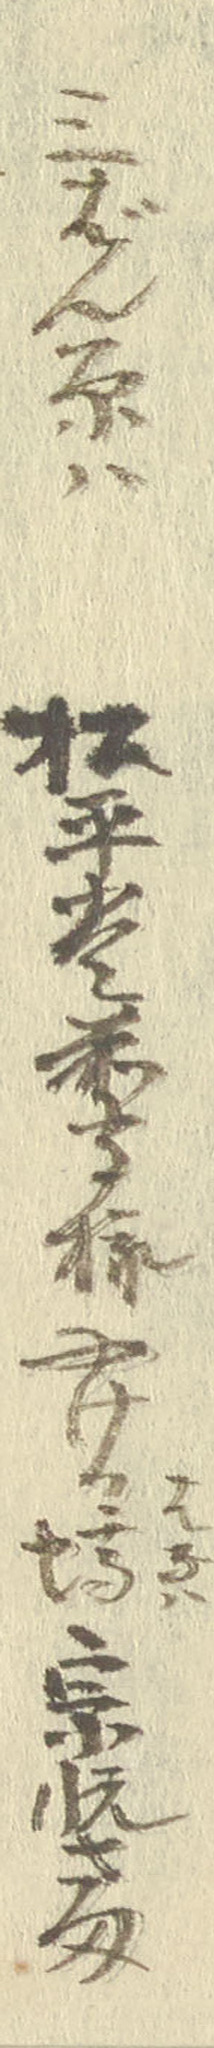三ばん原ハ松平豊前守様やける塙宗悦さま
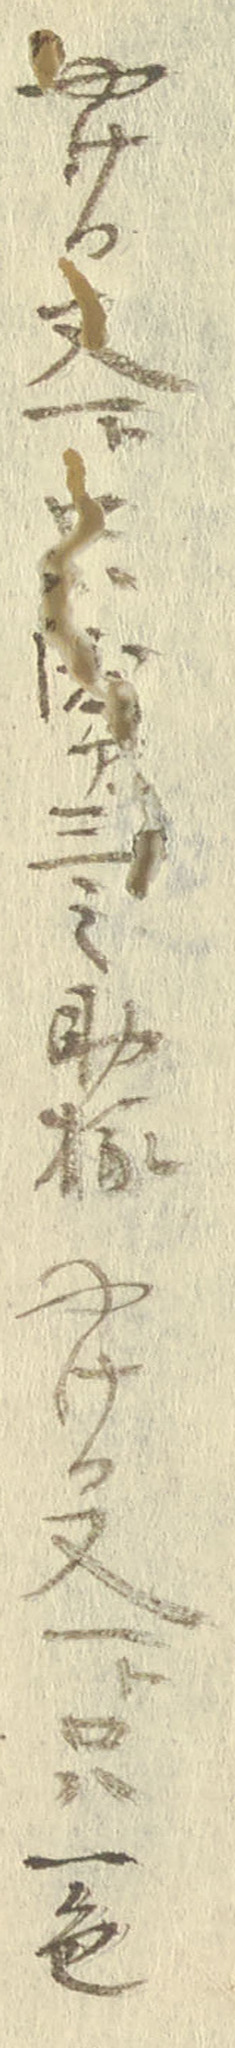やける又一ト口ハ渡部三之助様やける又一ト口ハ一色
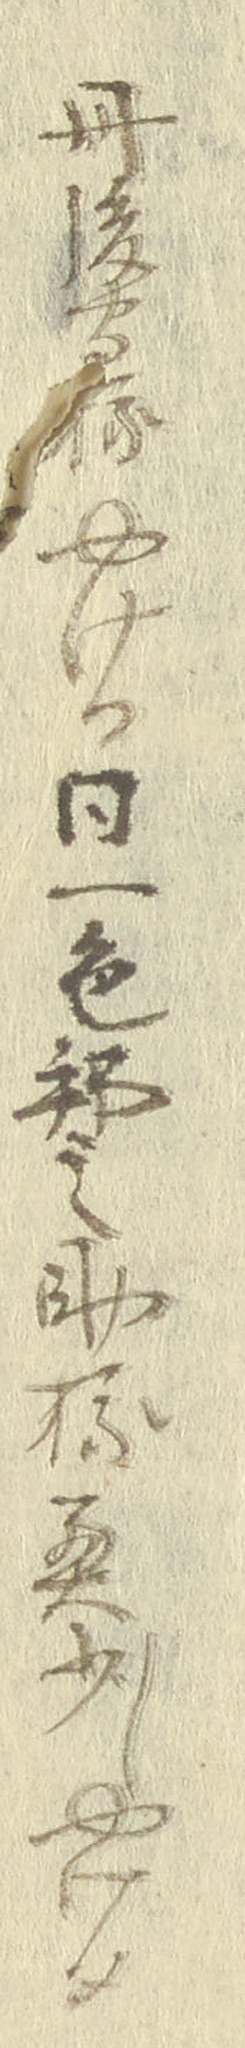丹後守様やける同一色邦之助様奥少しやける
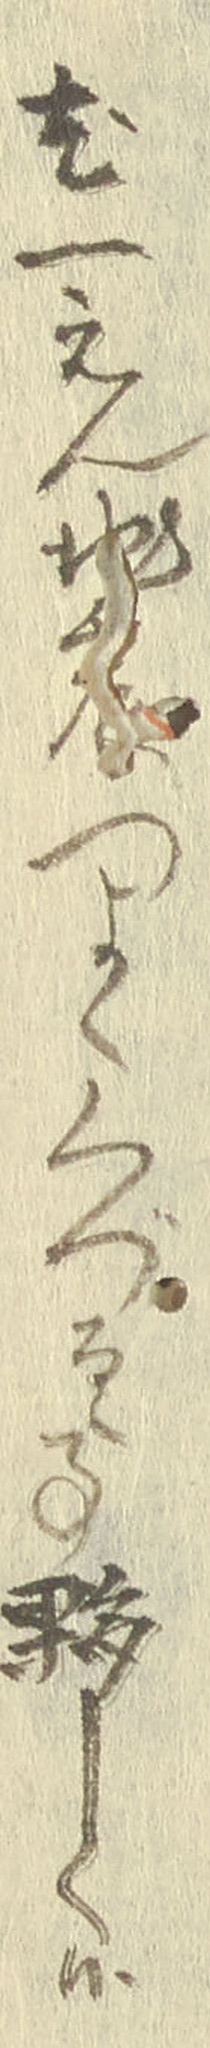尤一えん地震つよくくづるゝ事夥しく候
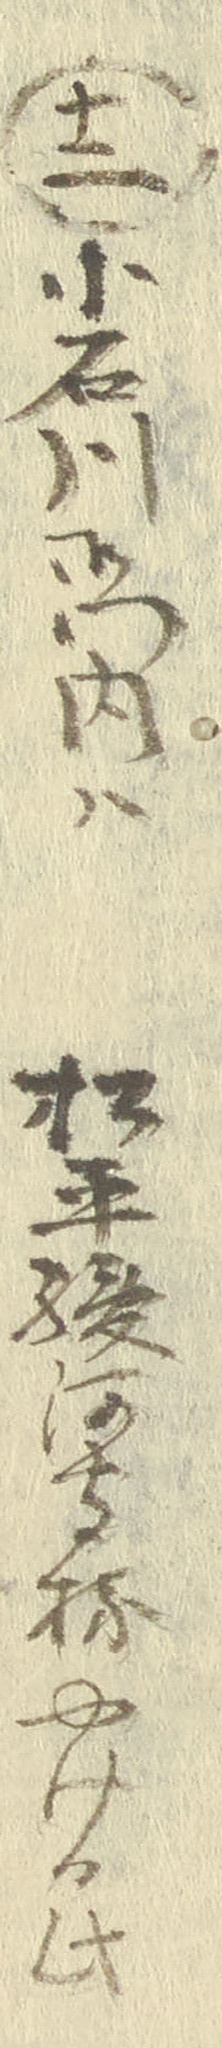十二小石川御門内ハ松平駿河守様やける此
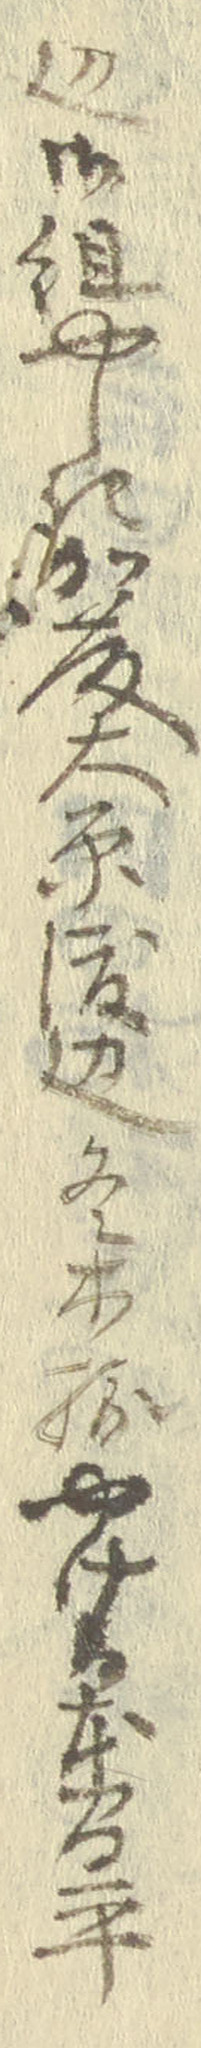辺御組やしき加藤大原渡辺冬木様やける本間平
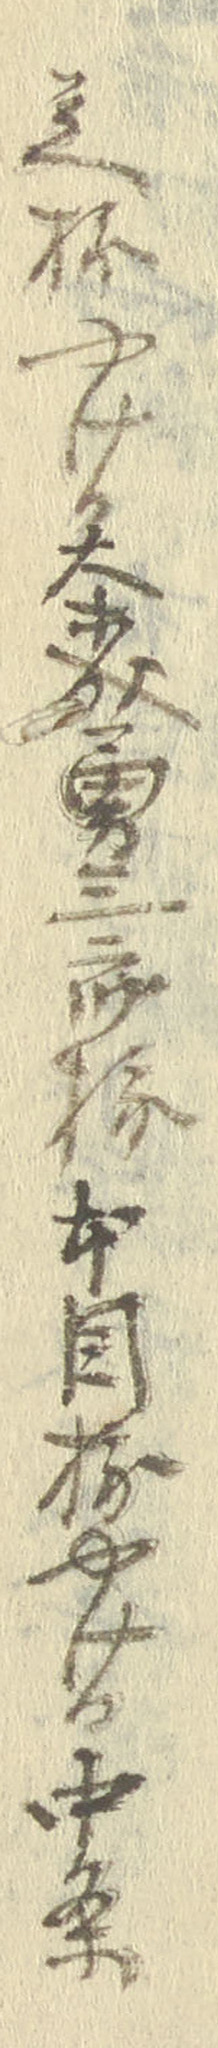兵へ様やける大森勇三郎様本目様やける中条

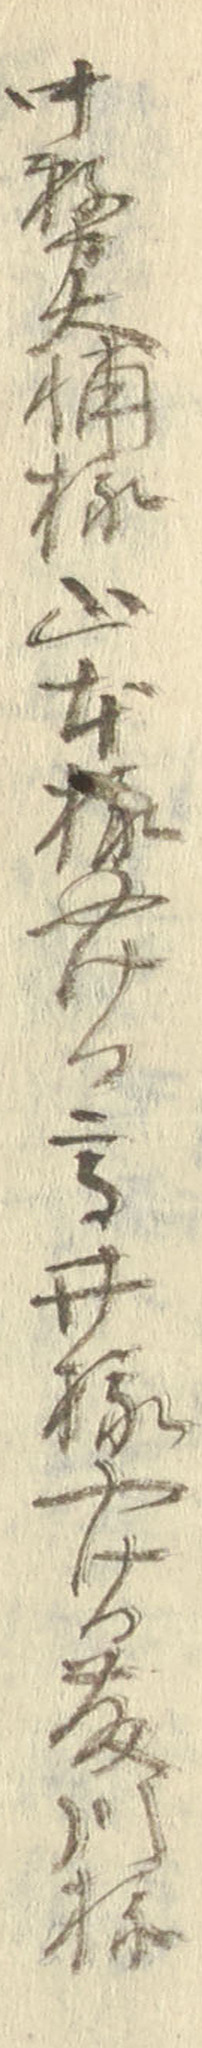中務大輔様山本様やける高井様やける藤川様
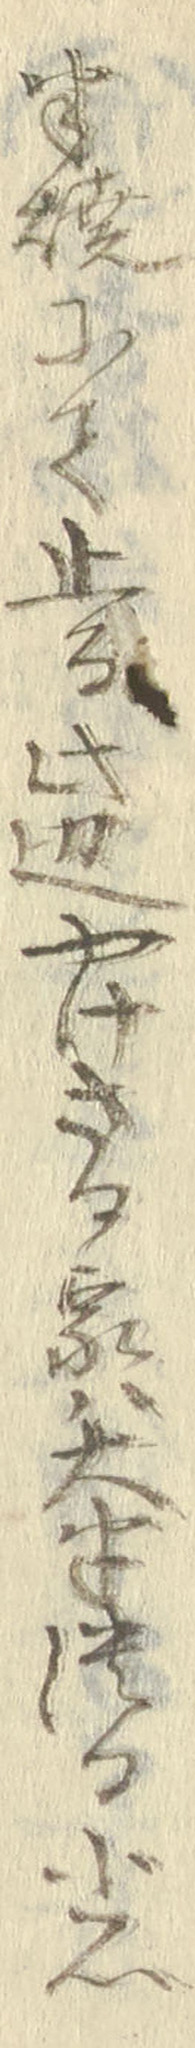半焼にて止る此辺やけさる家ハ大半潰る小石
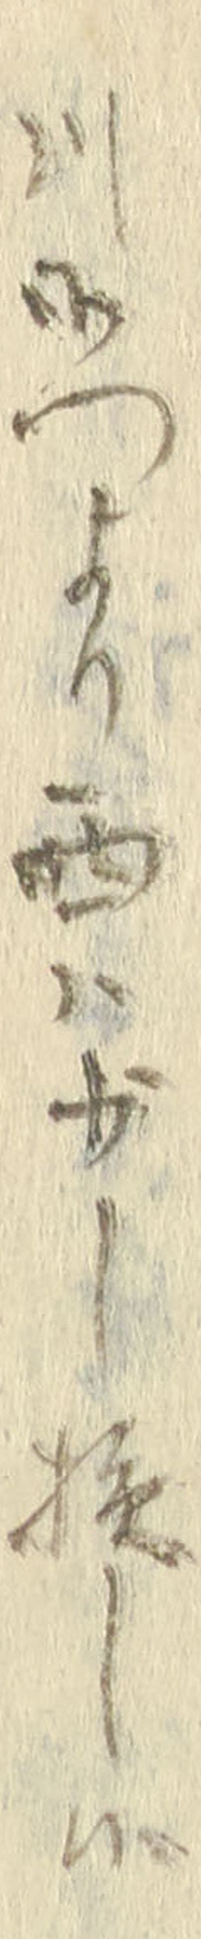川御門より西ハ少し損し候
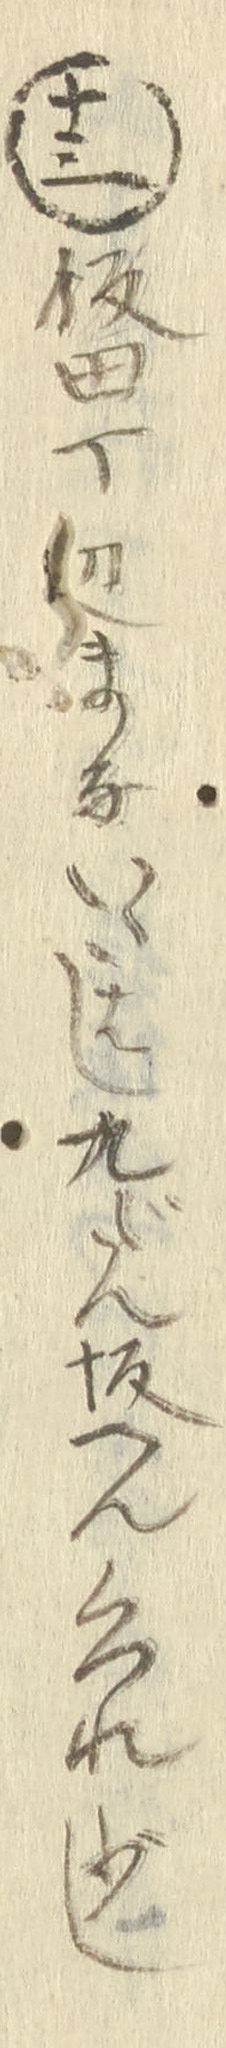十三飯田丁辺まないたはし九だん坂へんくつれ少し
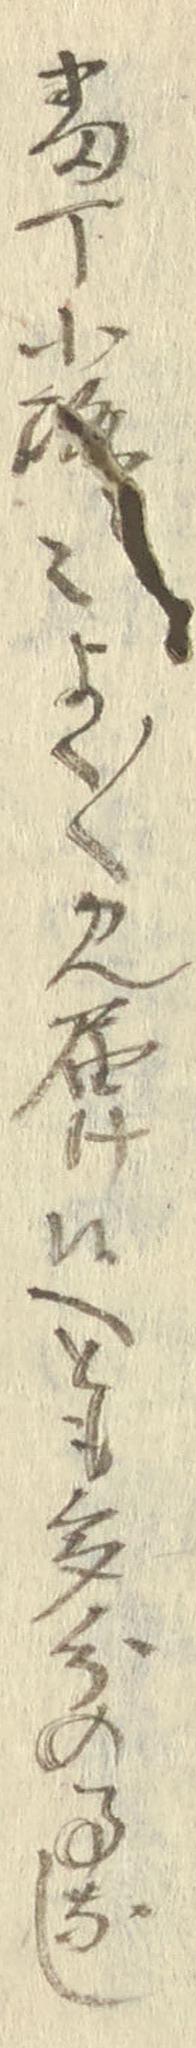番丁小〻よく〳〵見届け候へとも多分の事なし
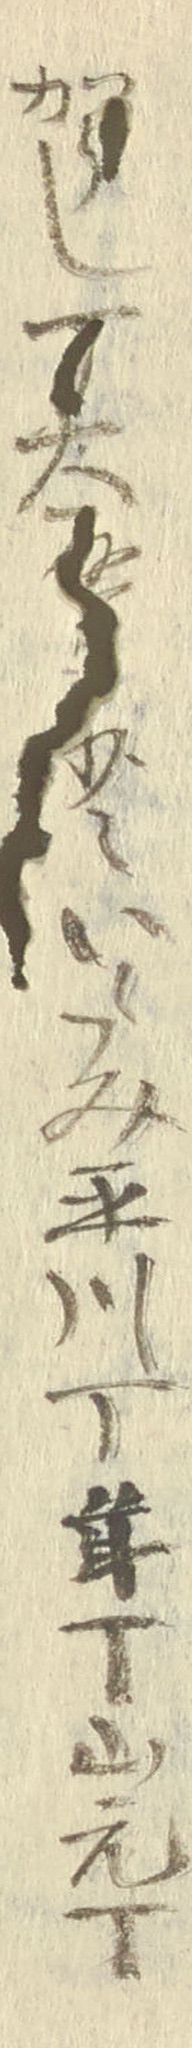からし丁大通り少〻いたみ平川丁隼丁山元丁
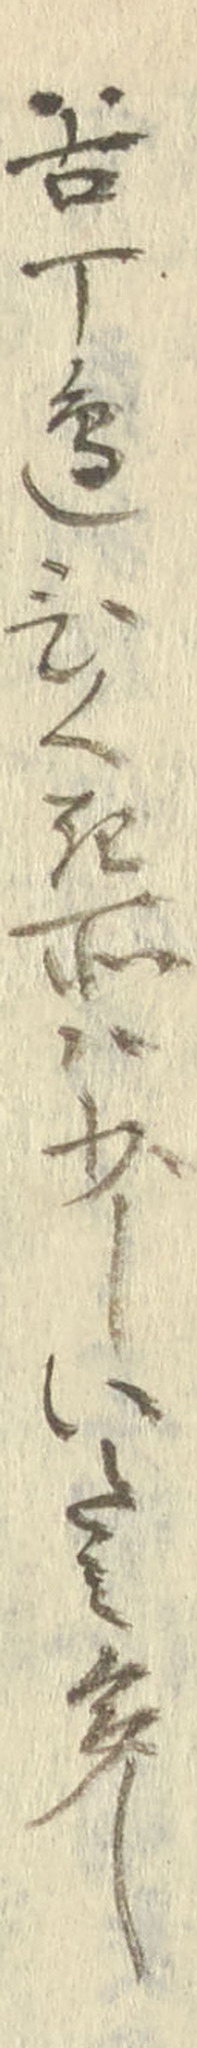谷丁邊ひくき所ハ少しいたミ多し
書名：御府内御屋敷方市中共地震類焼場所明細書之冩兼街道筋近郷聞書
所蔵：東京大学総合図書館 General Library in the University of Tokyo, JAPAN
